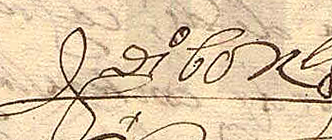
dio botelh
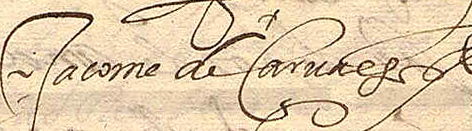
Jacome de Carualho
